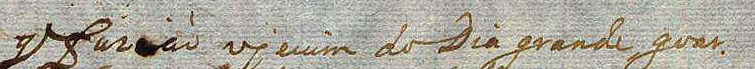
q̄ faziaõ o jeuim do Dia grande, guar
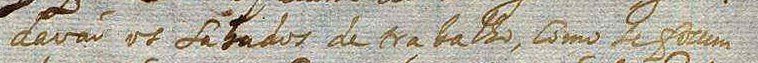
davaõ os sabados de trabalho, como se fossem
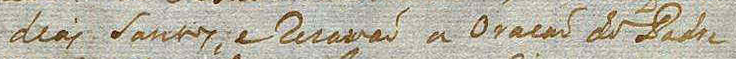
dias santos, e Rezavaõ a Oraçaõ do Padre
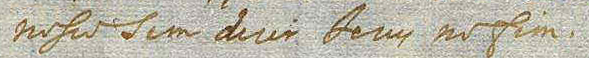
nosso sem dizer Iesus no fim.
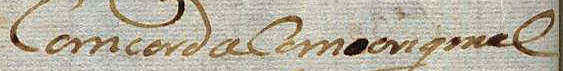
Comcorda Com o original
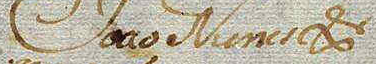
Ioaõ Nunes xer
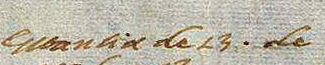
estancia de 13. de
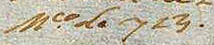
M.co de 713.
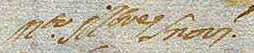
Mto Ill.tres Snors̄.
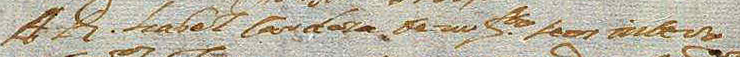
A R. Izabel Cardoza tem f.to seus intero
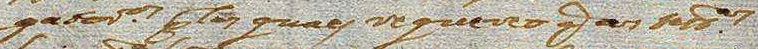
gator.os p.las quaes requereo q̄ as test.as
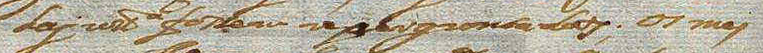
da just.a fossem reperguntadas, os mes
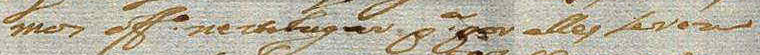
mos off.o neste lugar p.a por elles serem
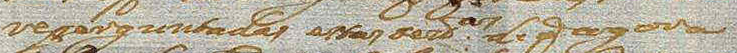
reperguntadas estas test.as de q̄ agora
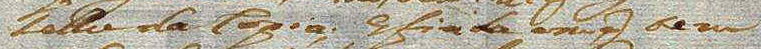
se lhe da Copia; E fiada em q̄ tem
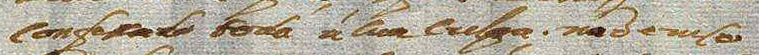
confessado toda a sua culpa naõ enco
